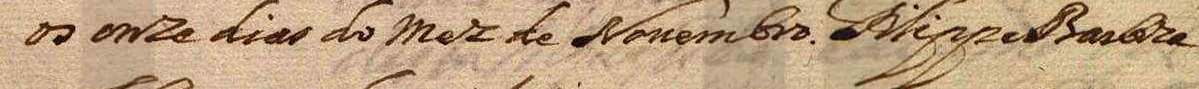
os onze dias do mez de Nouembro. Filippe Barboza
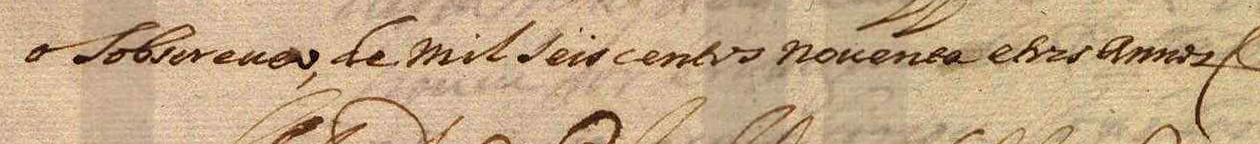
o Sobscreueo de mil seiscentos nouenta e tres annos
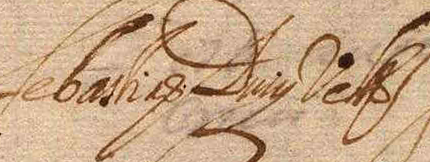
Sebastiaõ Dinis Velho
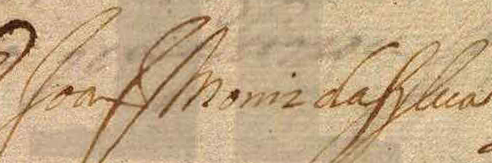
Joaõ Moniz da Sylua
